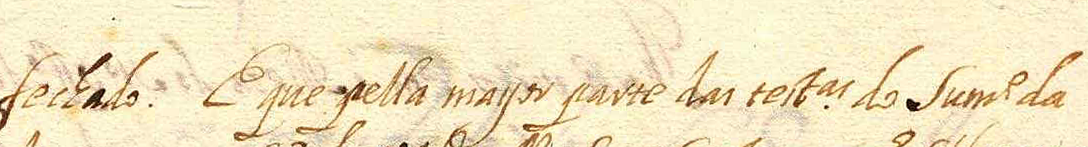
fechado. E que pella mayor parte das test.as do Sum.o da
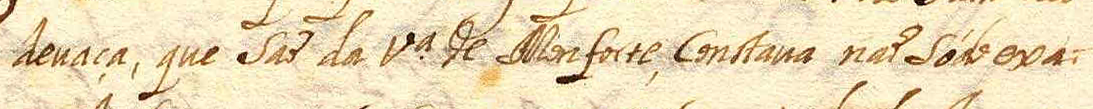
deuaça, que Saõ da V.a de Monforte, Constaua naõ só do exa
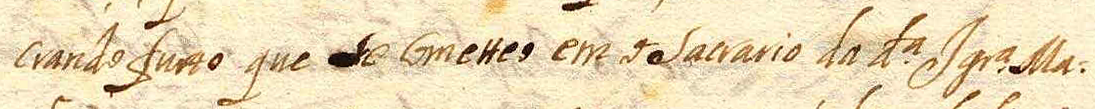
crando furto que se cometteo em o Sacrario da d̄a. Jgra Ma
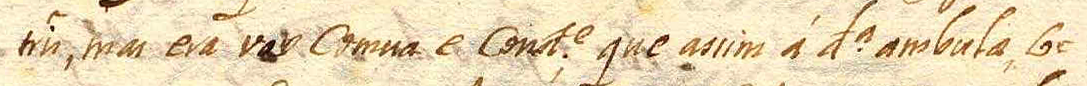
tris, mas era vos Comua e Const.e que assim à d̄a. ambula, co
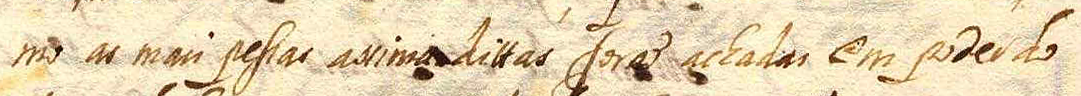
mo as mais pessas assima dittas foraõ achadas em poder do
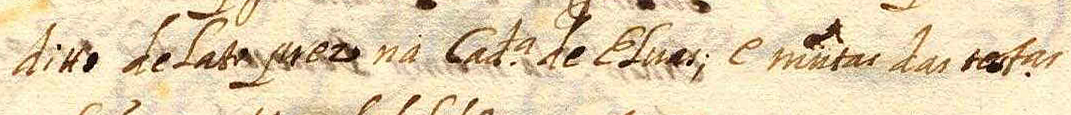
ditto deLato prezo na Cad̄.a de Eluas; e mūtas das test.as
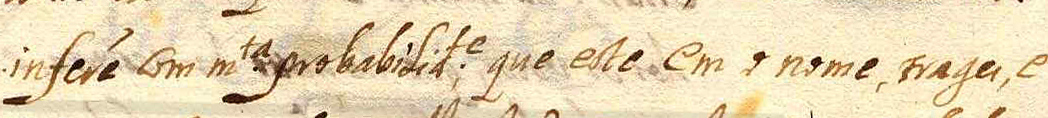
inferē com m.ta probabilid̄.e que este em o nome, trages, e
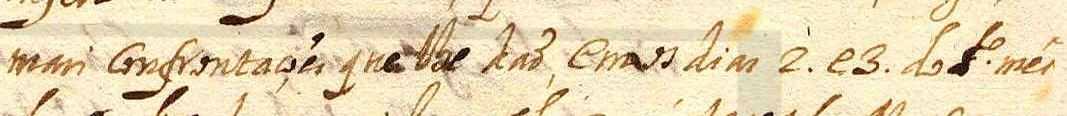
mais confrontações que lhe daõ, em os dias 2. e 3. do d̄.o mês
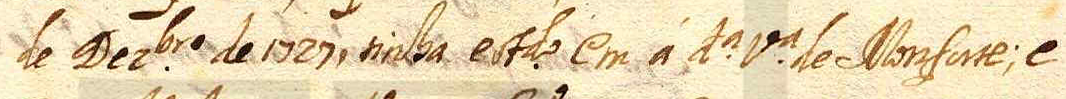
de Dez.bro de 1727, tinha est.do em a d̄.a V.a de Monforte; e
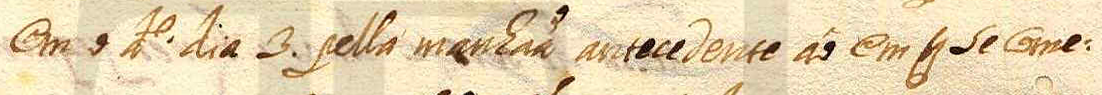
em o d̄o. dia 3. pella manhaã antecedente áo em q̄ se come
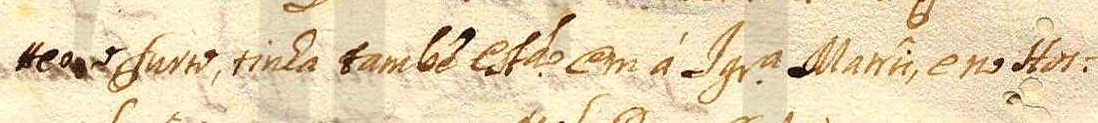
teo o furto, tinha tambē est.do em a Igr.a Matris, e no Hos
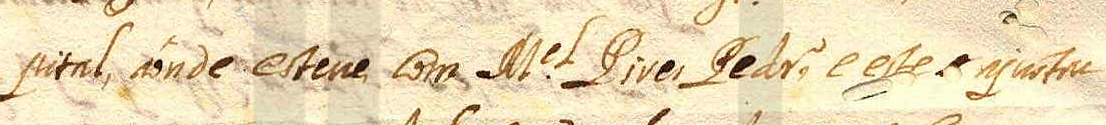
pital, aonde esteue com M.el Pires Pedr.o e este o ajustou
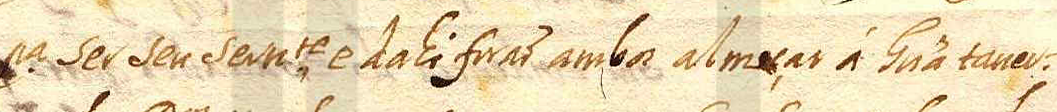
p.a ser seu serute, e dahi foraõ ambos almoçar á huā tauer
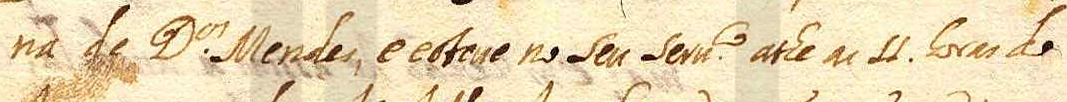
na de D.os Mendes, e esteue no seu seru.co athe as 11. horas do
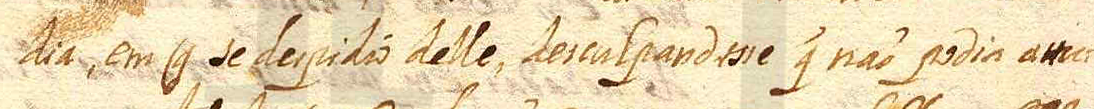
dia, em q̄ se despidio delle, desculpandosse q̄ naõ podia attu
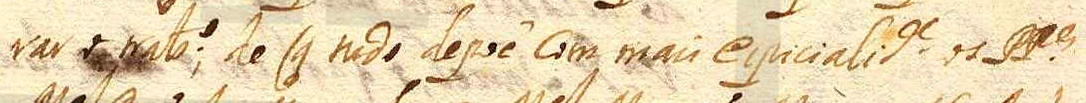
rar o trato; de q̄ tudo depoē com mais espicialid.e os PP.es
